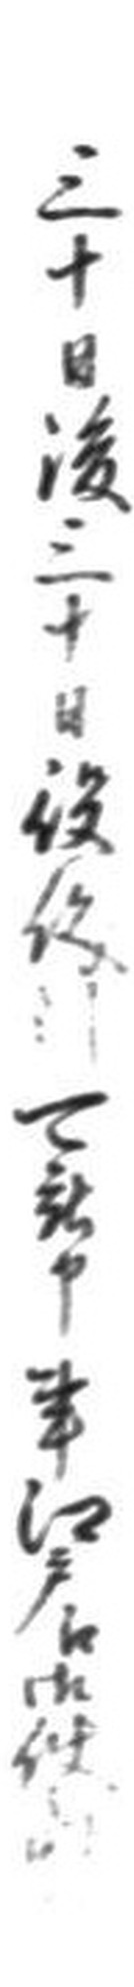三十日後三十日役儀引可被申事江戸江御使之時
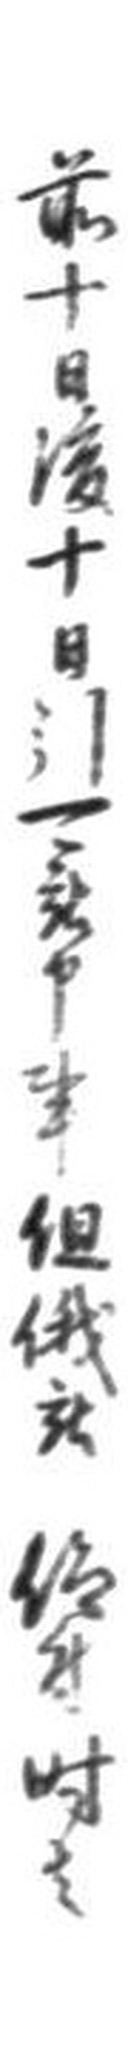前十日後十日引可被申事但俄被仰付時は
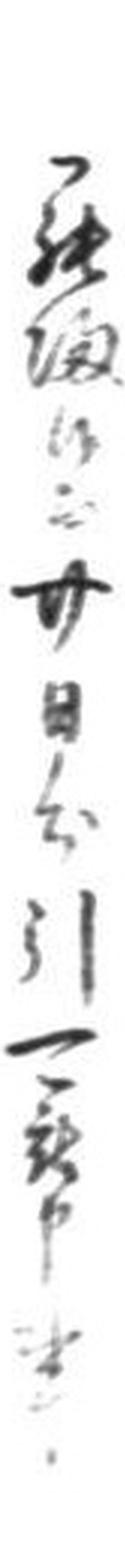罷帰候而廿日分引可被申事
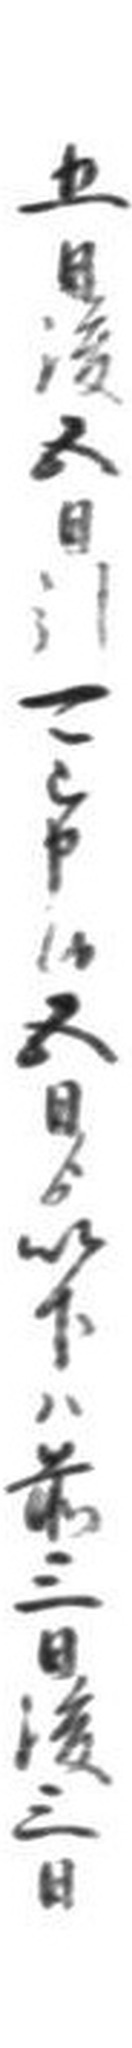五日後五日引可被申候五日ゟ以下は前三日後三日
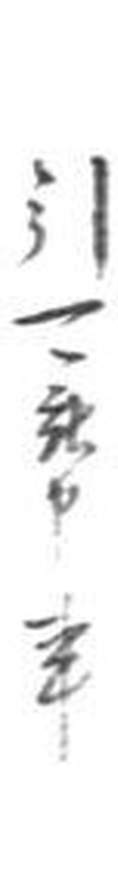引可被申事
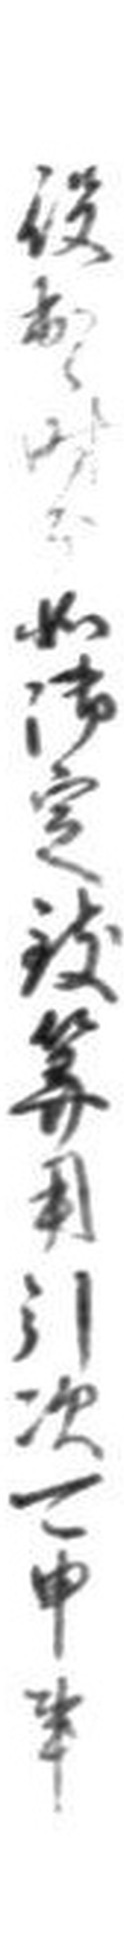役出候時分如御定致算用引次可申事

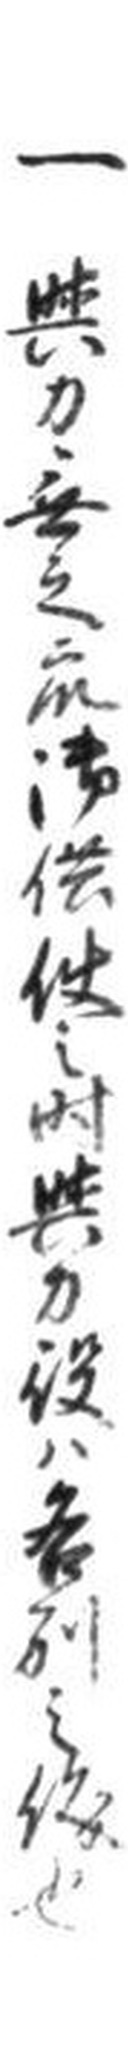一与力無之衆御供使之時与力役は各別之儀也
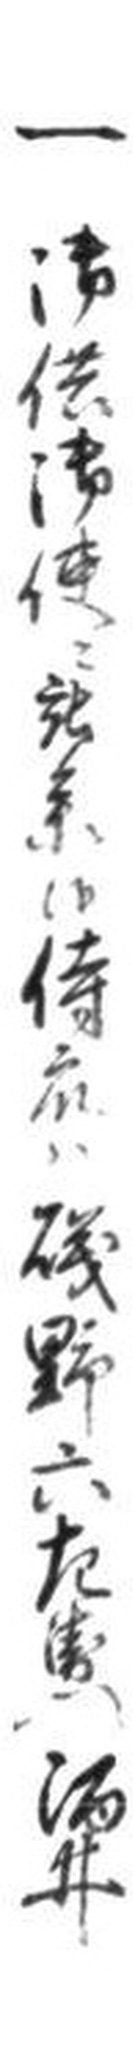一御供御使ニ被参候侍衆は磯野六左衛門酒井
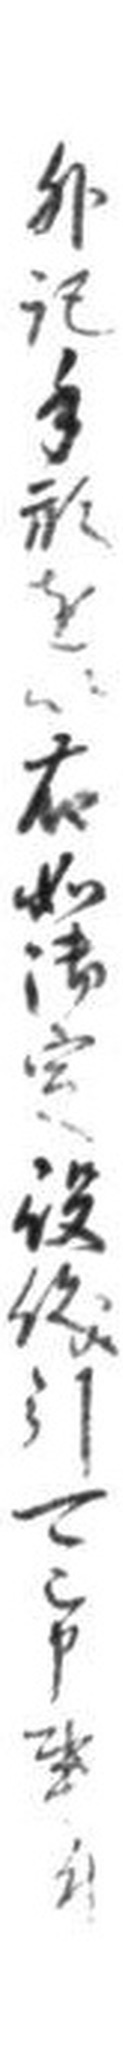外記手形を以右如御定役儀引可被申事付
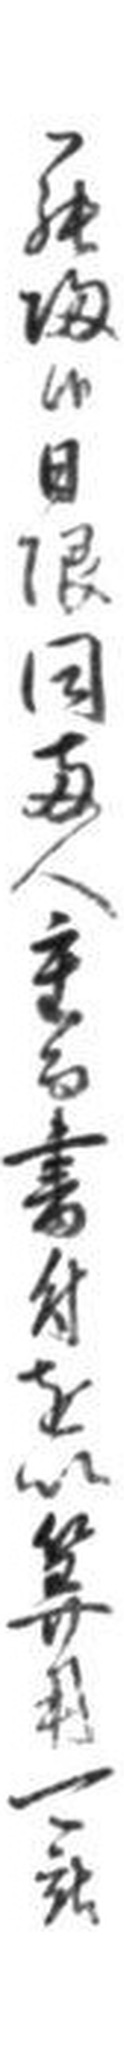罷帰候日限同両人重而書付を以算用可被
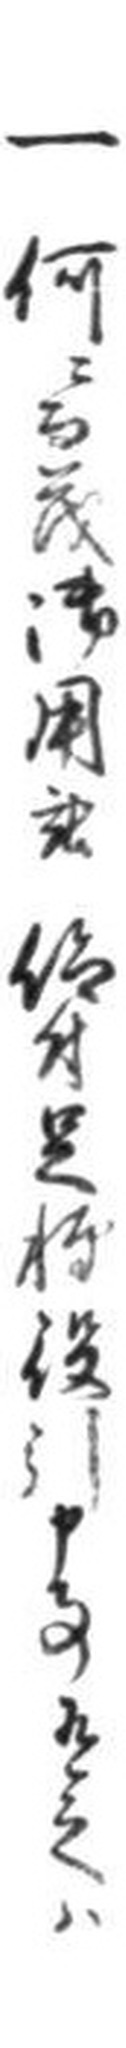一何ニ而も御用被仰付足軽役引申事有之は
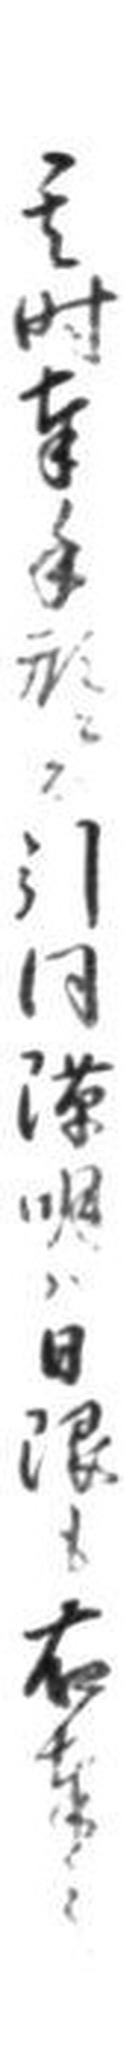其時奉手形ニ而引同隙明は日限も右奉候
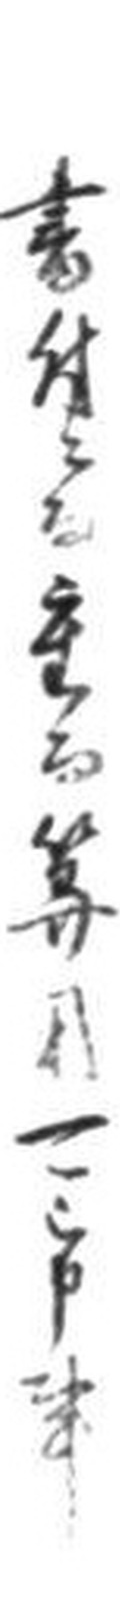書付ニ而重而算用可被申事
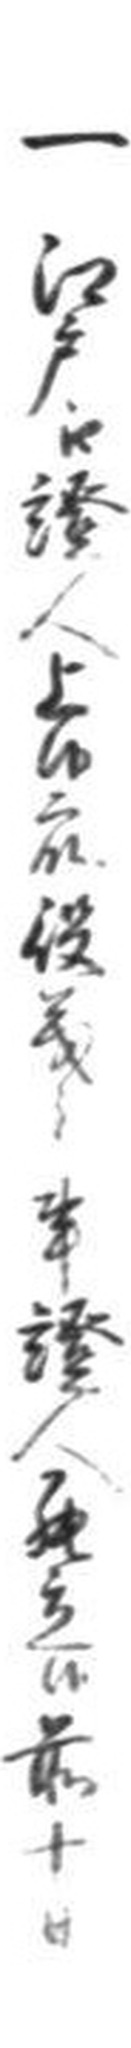一江戸江証人上候衆役義之事証人罷立候前十日
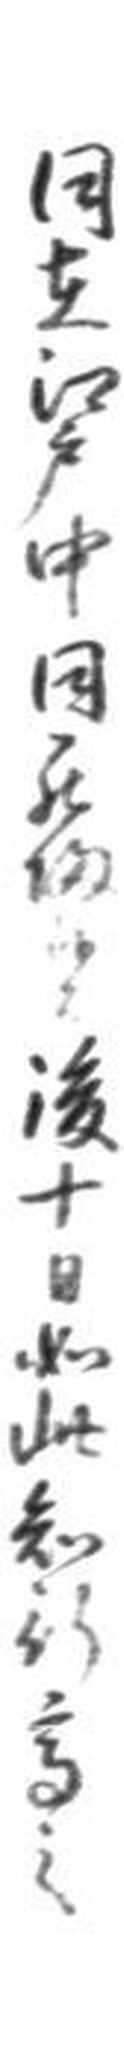同在江戸中同罷帰候後十日如此知行高之
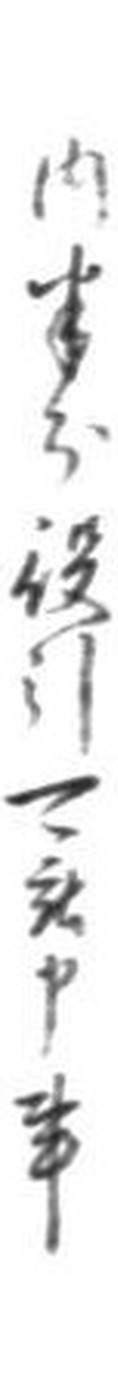内半分役引可被申事
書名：家譜 三 忠昌公 従慶長八年到寛永六年
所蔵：福井県文書館 Fukui Prefectural Archives
